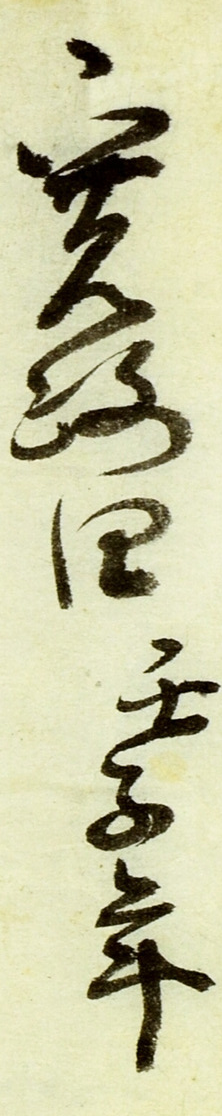印寛政四壬子年
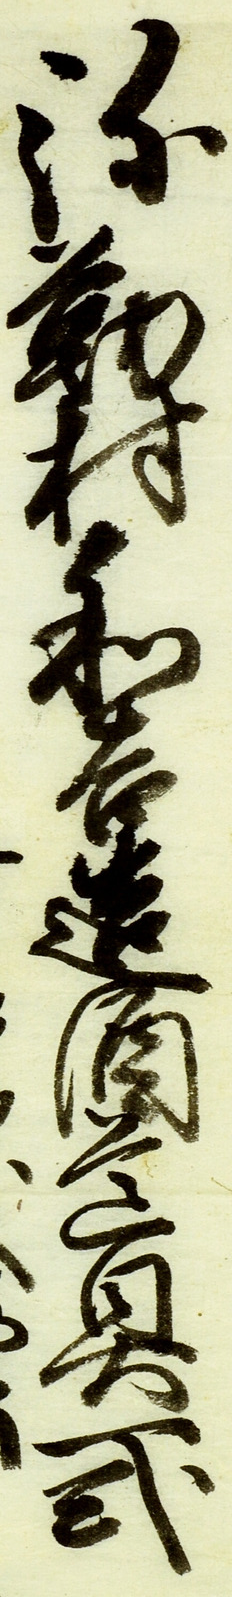弥勒村和吉造酒道具一式
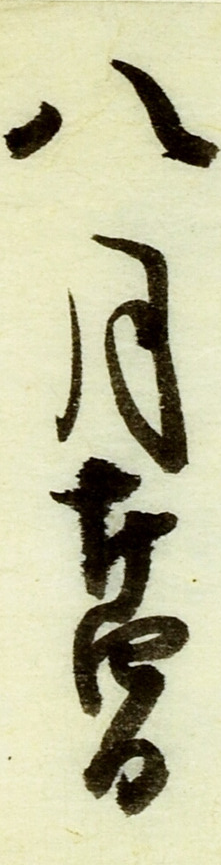八月廿四日
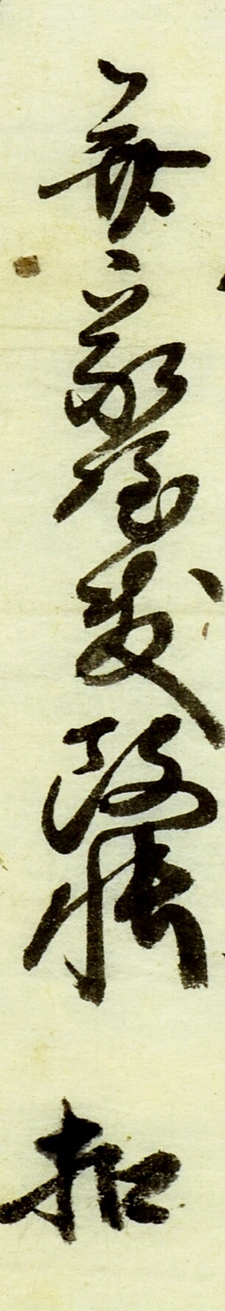並家屋敷改帳扣
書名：弥勒村和吉造酒道具一式并家屋敷改帳扣
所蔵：伊那市立高遠町図書館・合同会社AMANE
